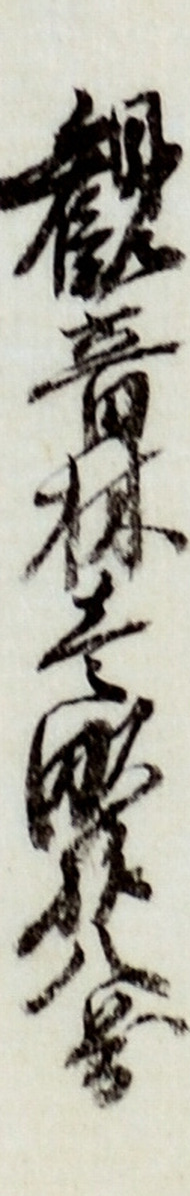観音林壱畝拾八歩同寺
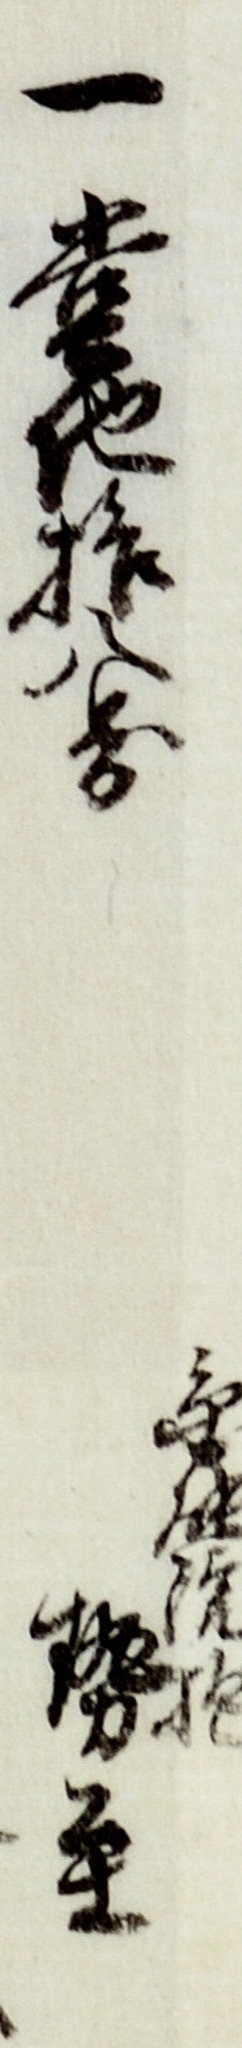一堂地拾八歩勢至
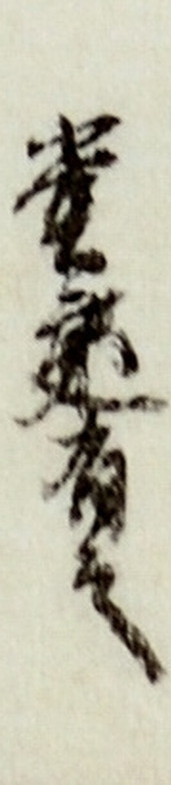堂建有之
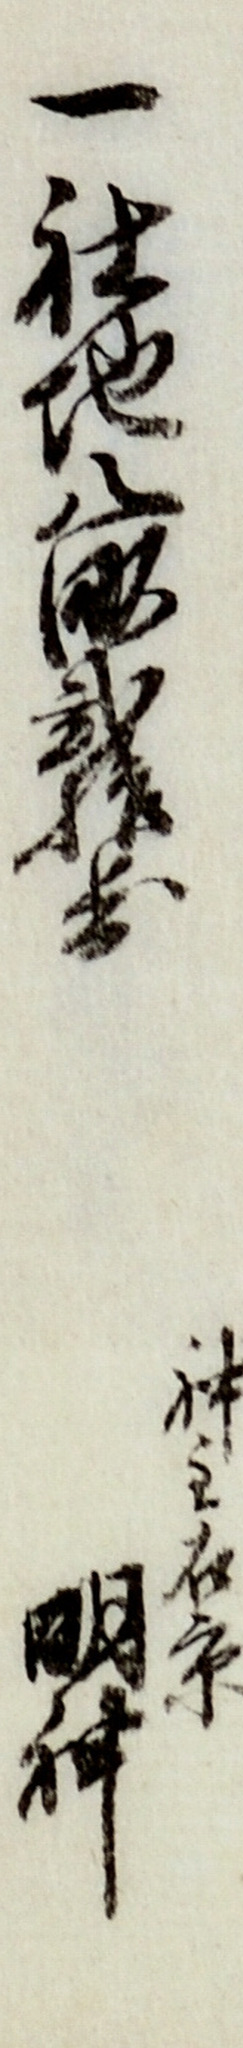一社地八畝弐拾歩明神
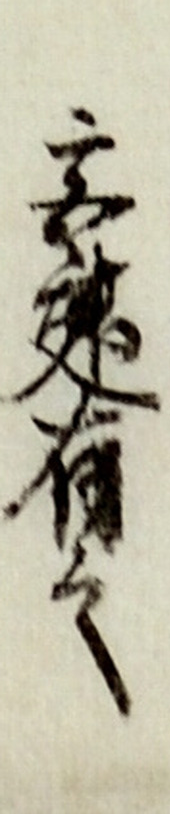宮建有之
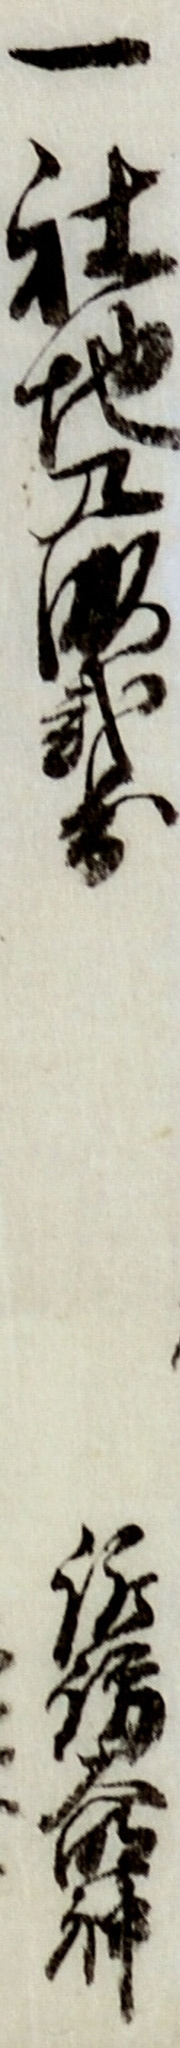一社地九畝弐歩諏訪大明神
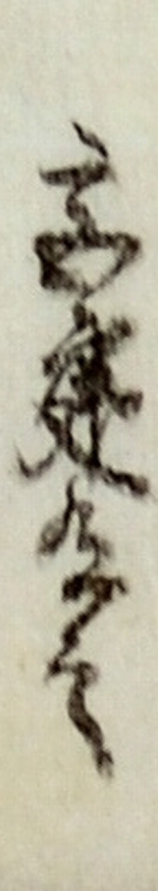宮建有之
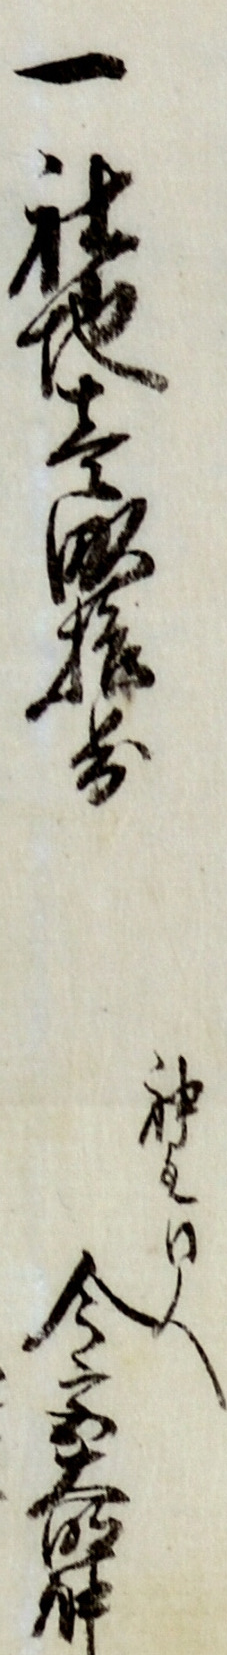一社地壱畝拾歩今宮大明神
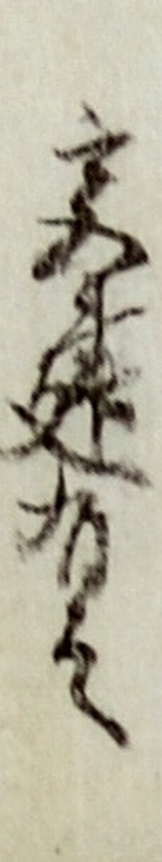宮建有之

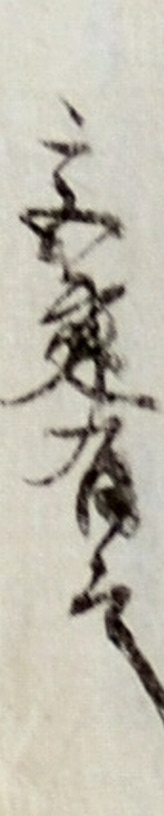宮建有之
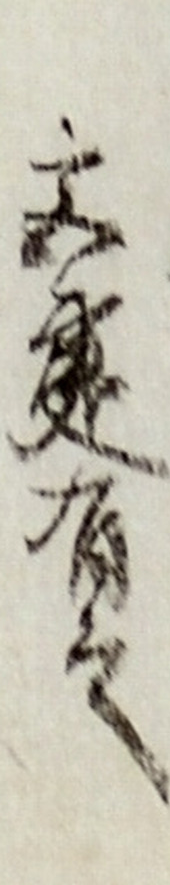宮建有之
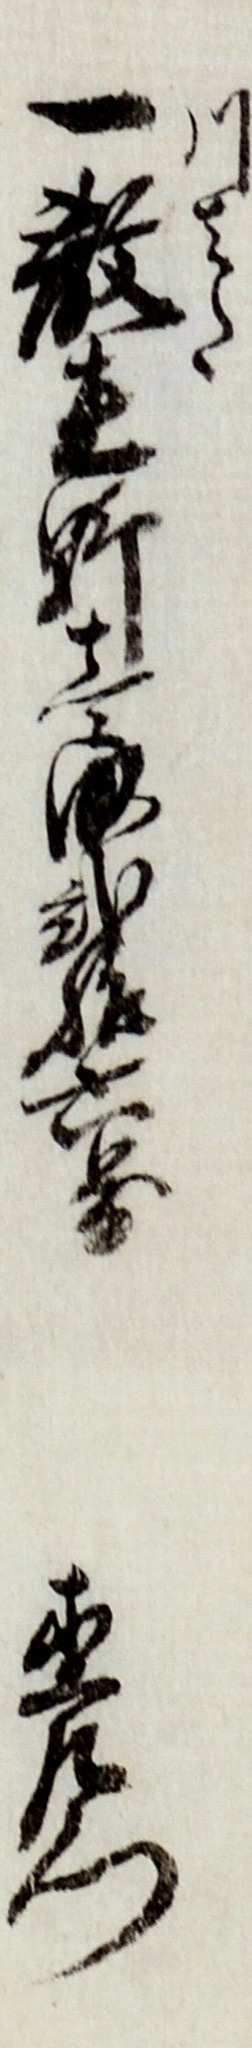一散在野壱畝弐拾六歩直左衛門
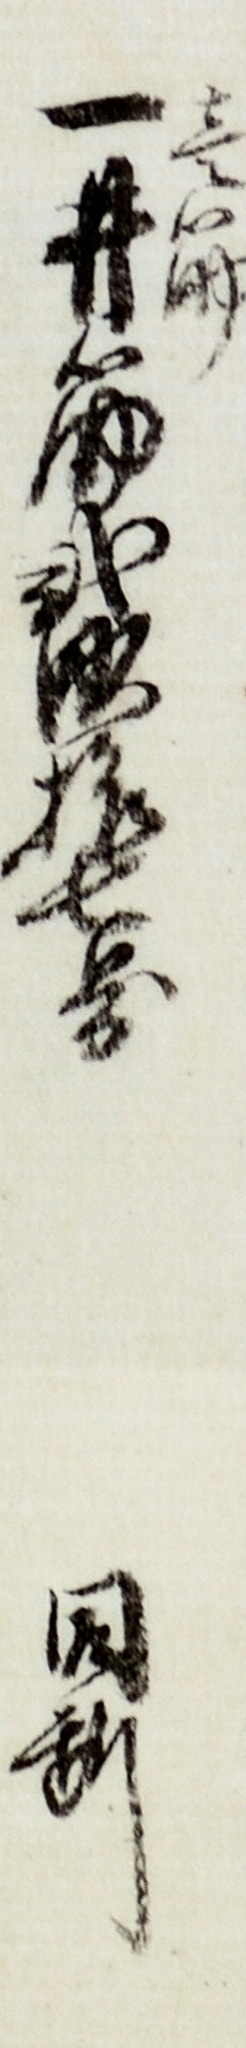一井筋弐畝拾七歩同断
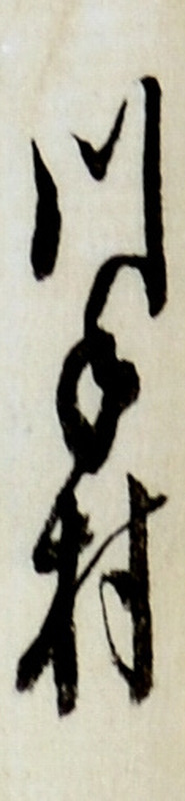川手村
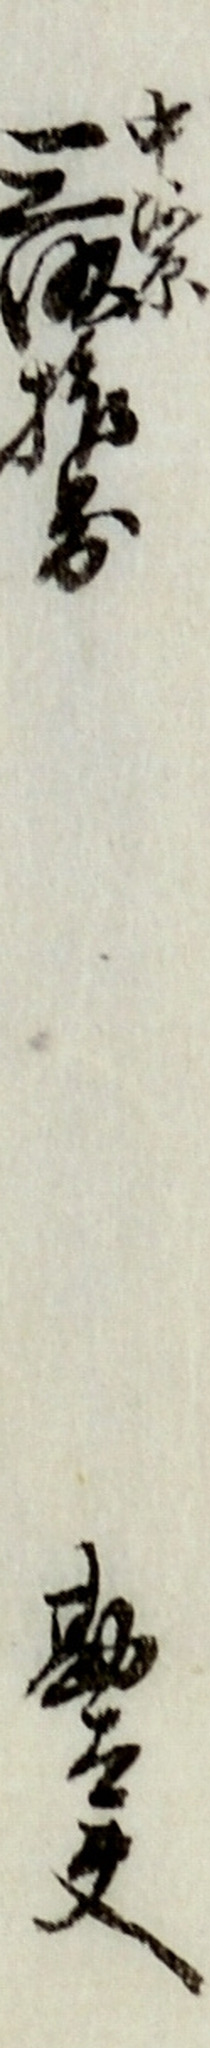三畝拾歩勘太夫
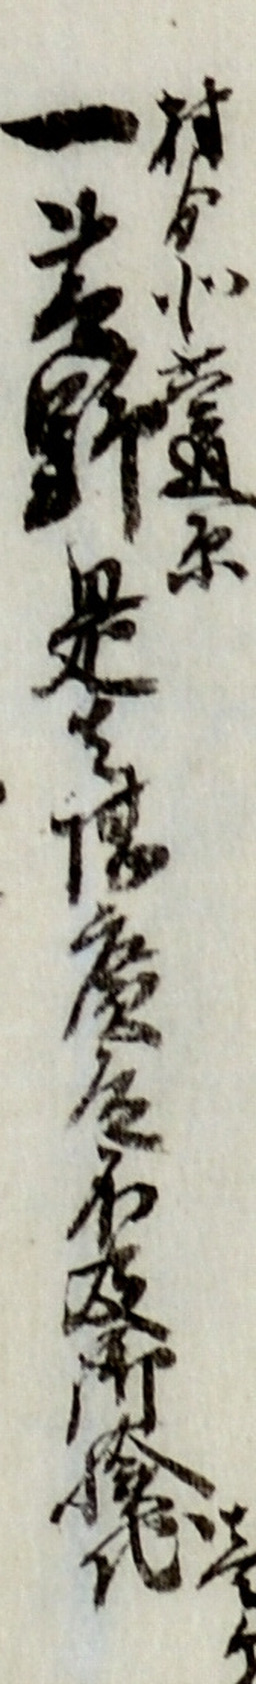一芝野是ハ場広故不及御検地村中
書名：御領分中山林社地手控
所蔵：伊那市立高遠町図書館・合同会社AMANE
